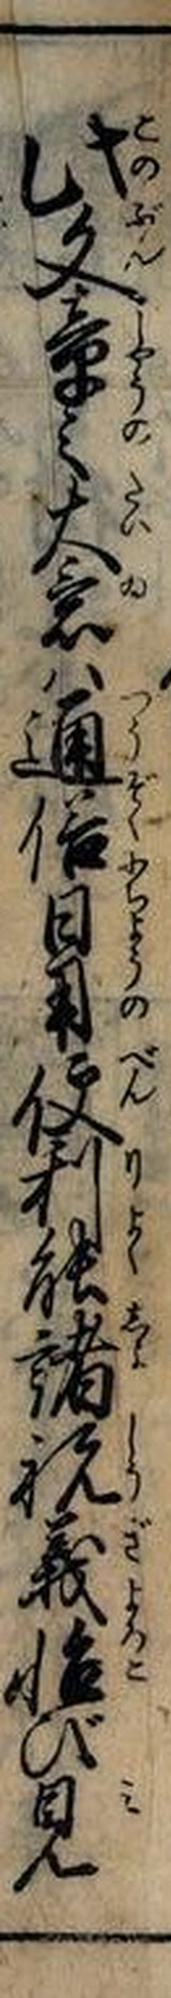此文章之大意は通俗日用便利能諸祝義怡び見
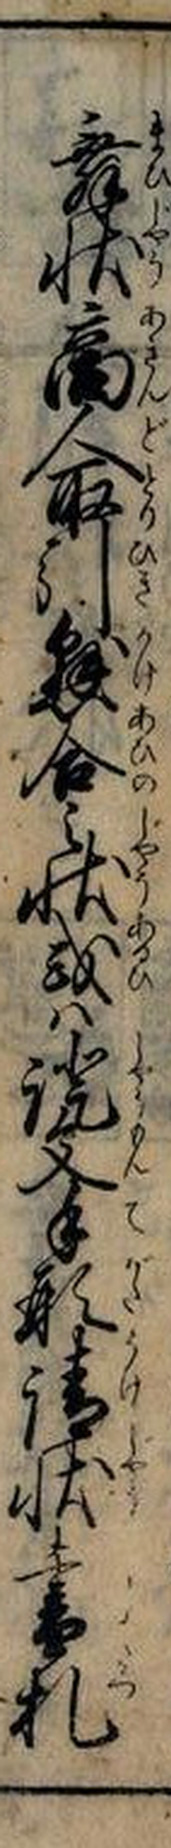舞状商人取引懸合之状或は證文手形請状と書札
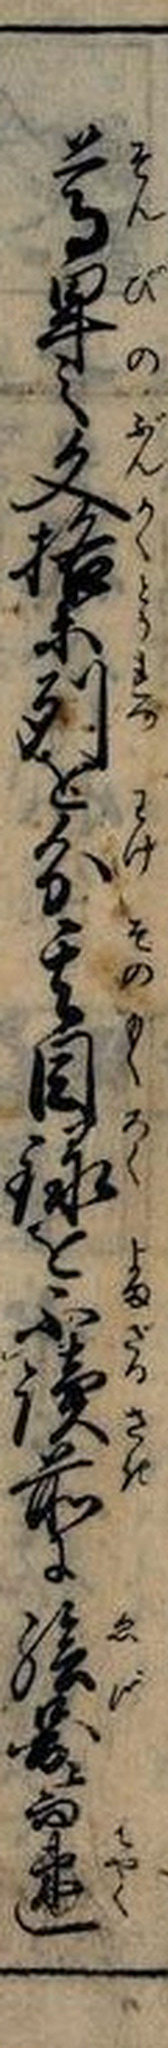尊卑之文格等列を分其目録を不読前に絵圖に而速
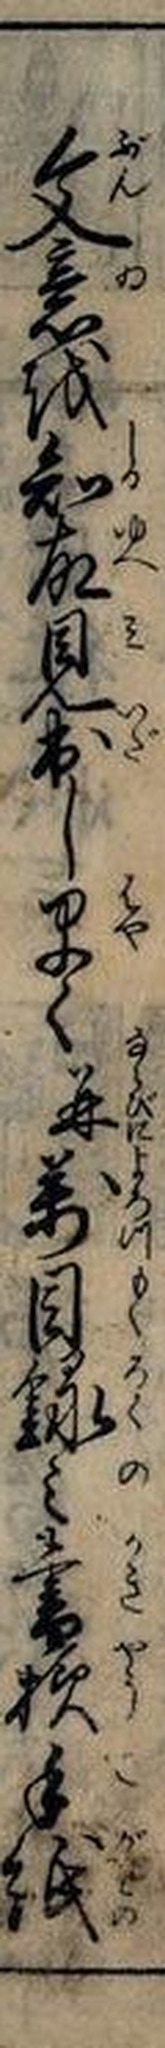文意を知故見出し早く并萬目録之書様手紙
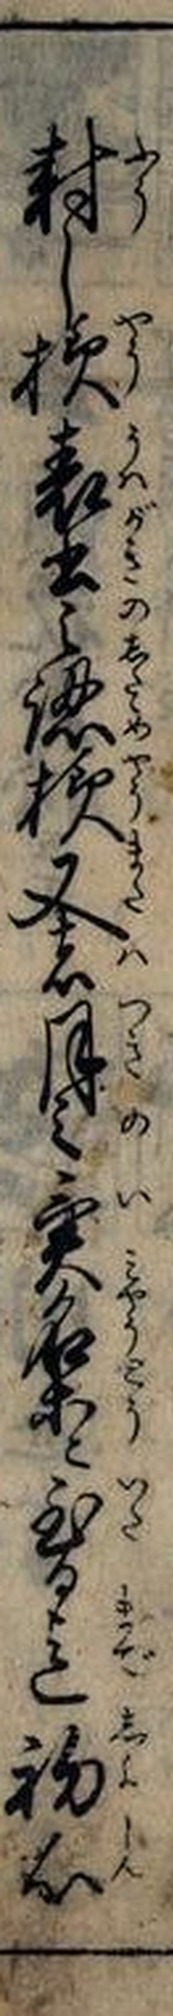封し様表書之認様又者月之異名等に至る迄初心
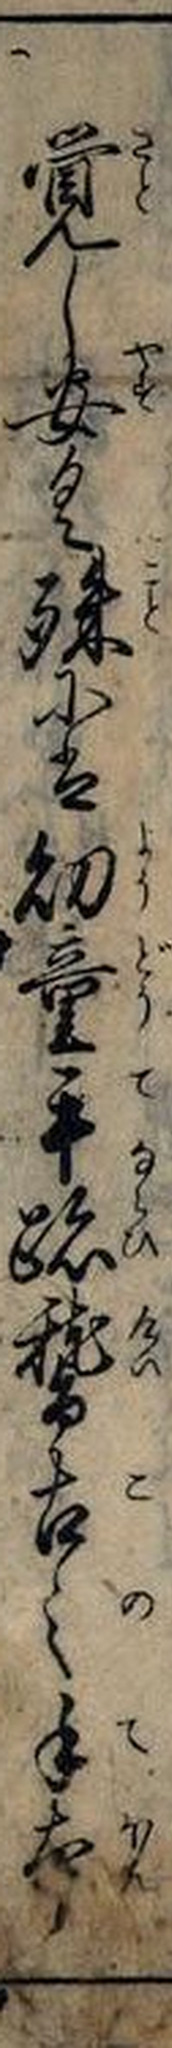覚し安く殊には幼童手跡稽古之手本
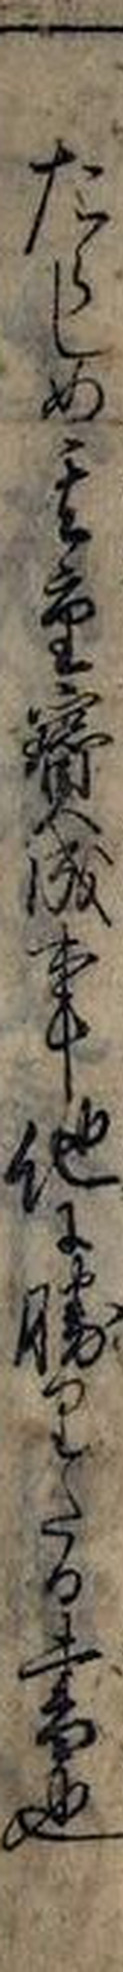たらしめ其重寶成事他に勝りたる書也

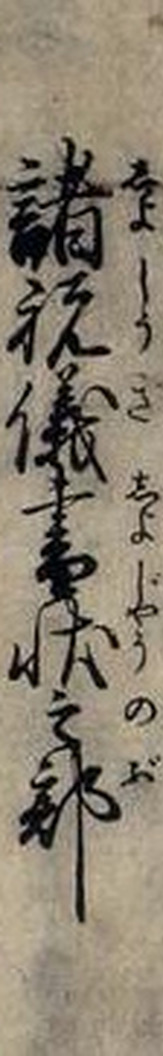諸祝儀書状之部

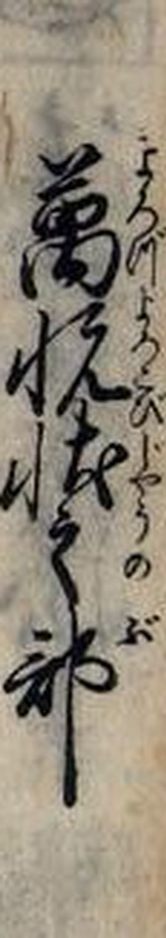萬悦状之部
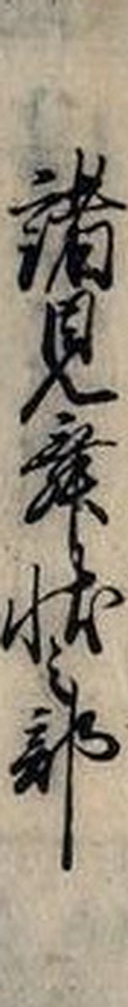諸見舞状之部
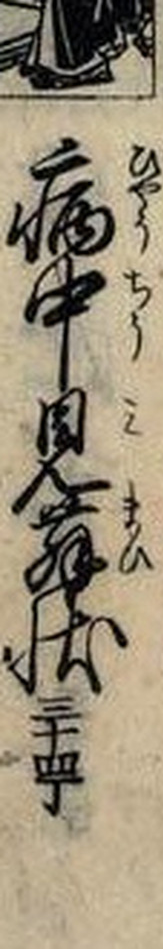忌中見舞状四十五丁
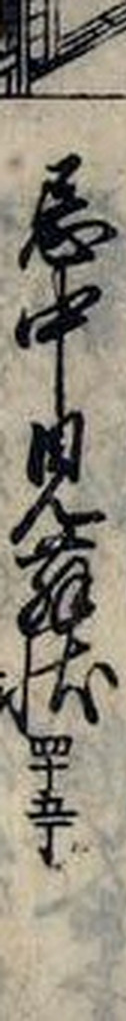忌中見舞状四十五丁

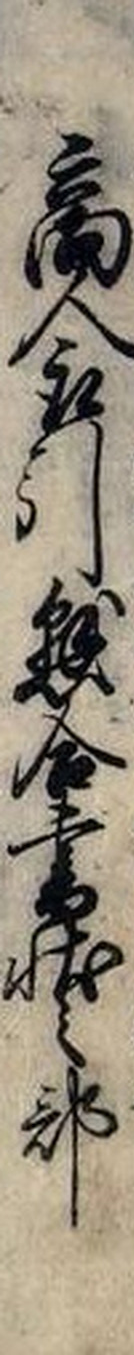商人取引懸合書状之部
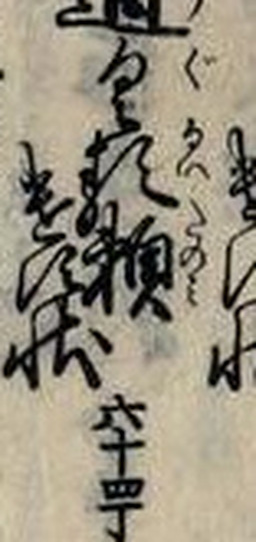遣す状

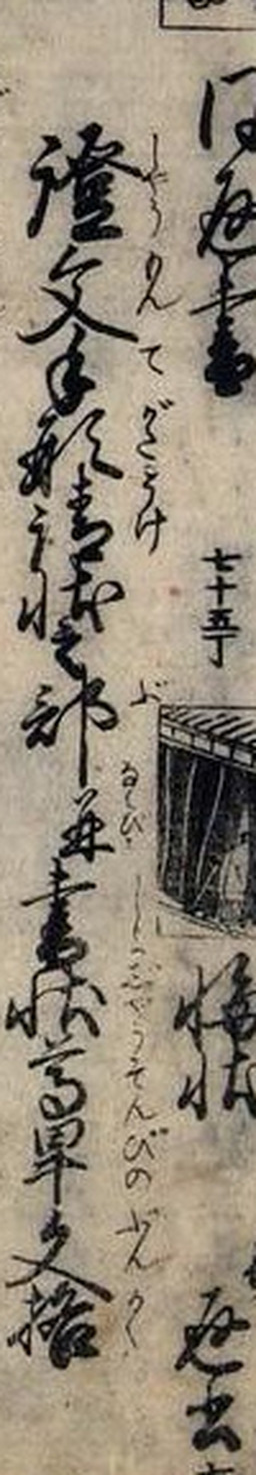證文手形請状之部并書状尊卑文格
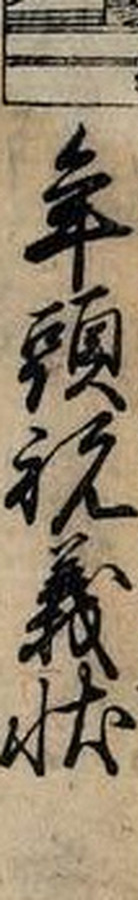年頭祝義状
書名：大成用文章（往来物）
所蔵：福井県文書館 Fukui Prefectural Archives
